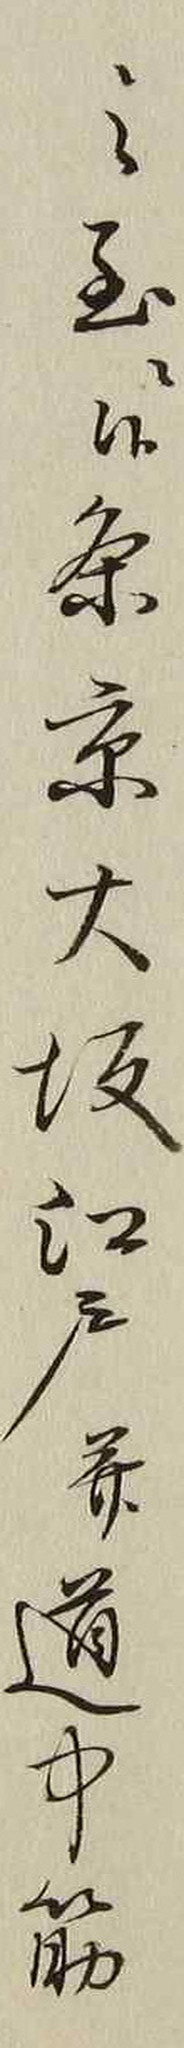之至ニ候条京大坂江戸并道中筋
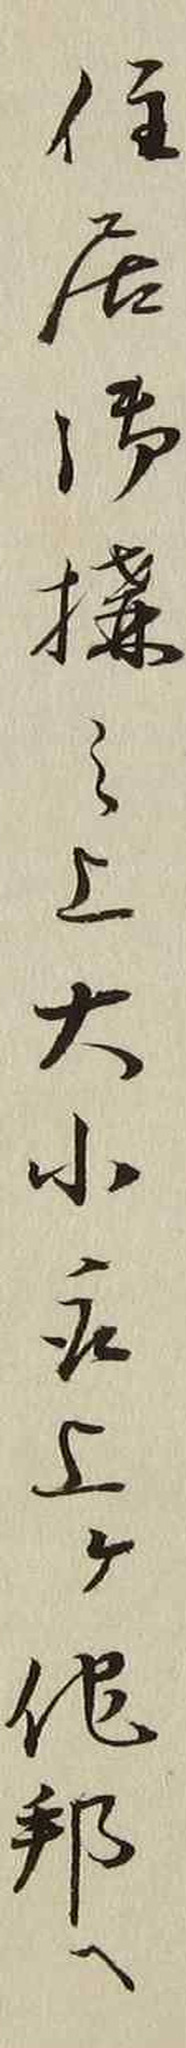住居御構之上大小取上ケ他邦へ
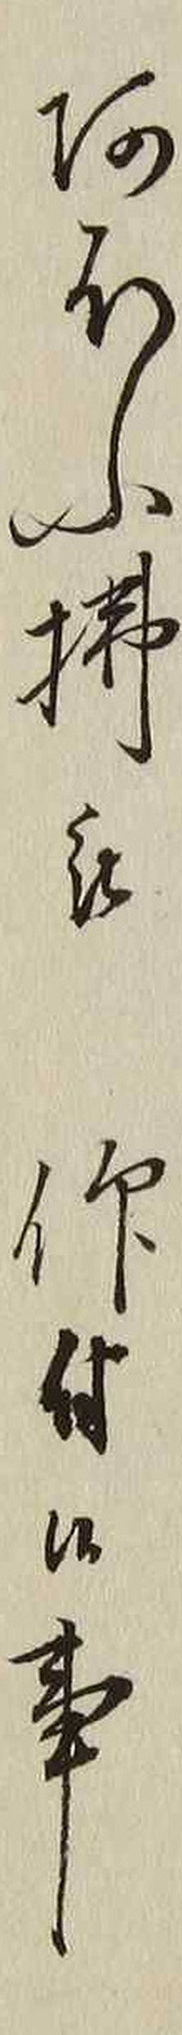あほふ払被仰付候事
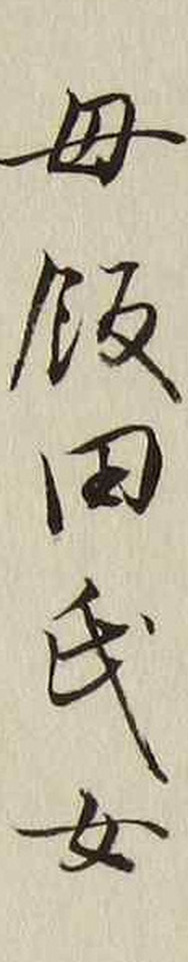母飯田氏女
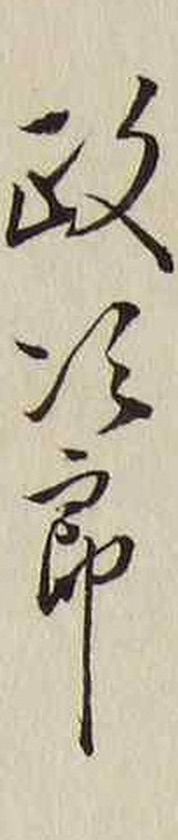政次郎
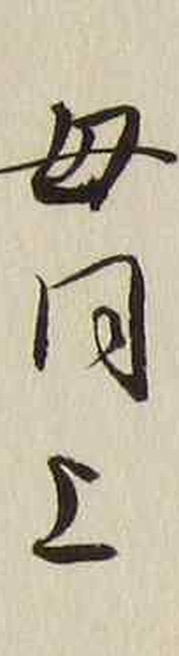母同上

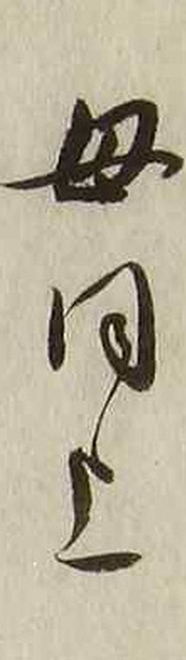母同上
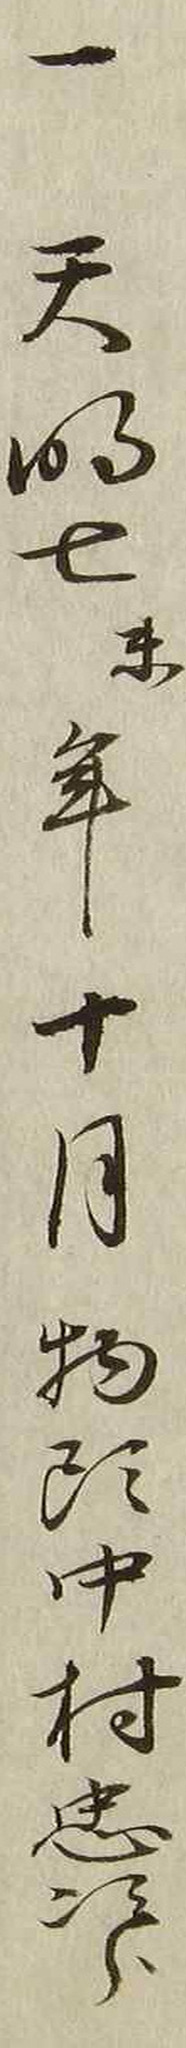一天明七未年十月物頭中村忠次郎
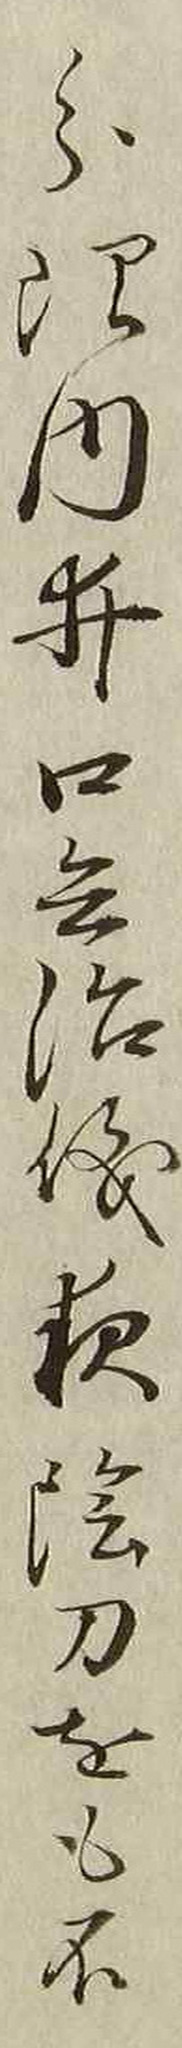分限内井口兵治儀夜陰刀をも不
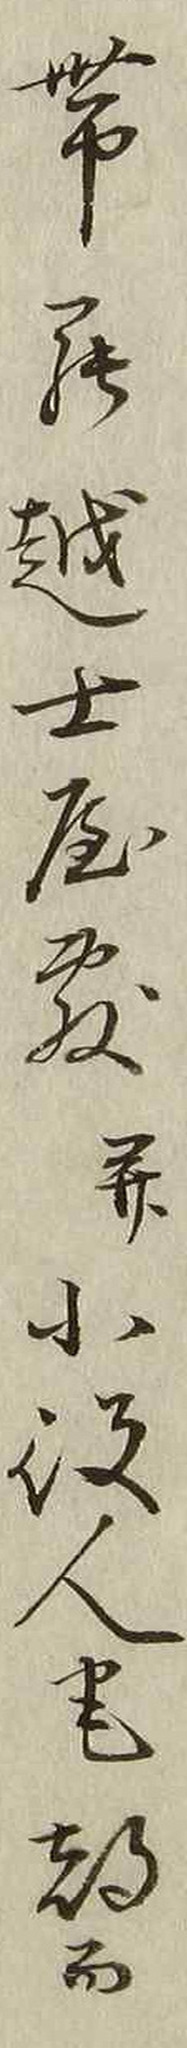帯罷越士屋敷并小役人宅都而
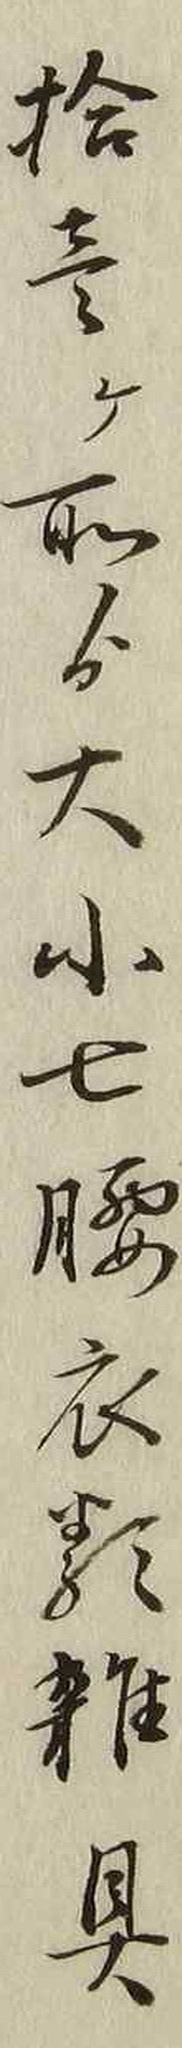拾壱ケ所ゟ大小七腰衣類雑具
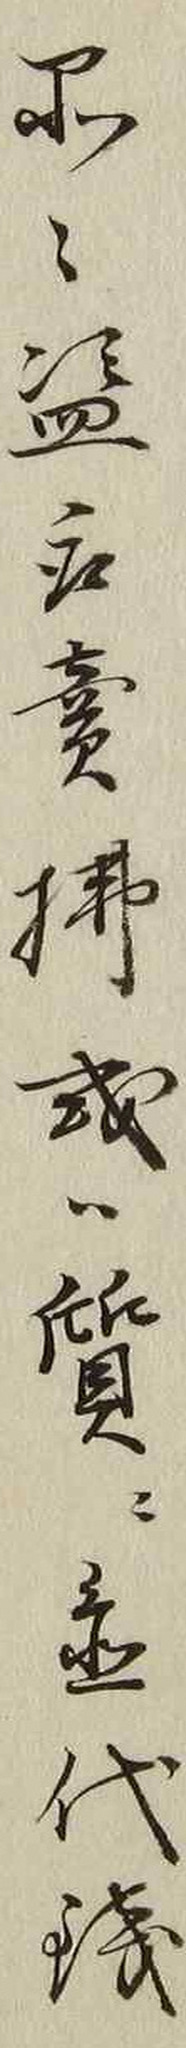品々盗取売払或ハ質ニ置代銭
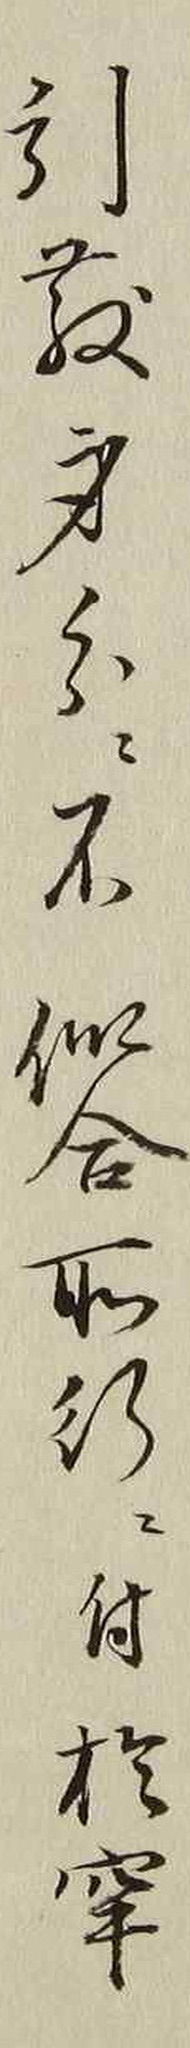引散身分ニ不似合所行ニ付於牢
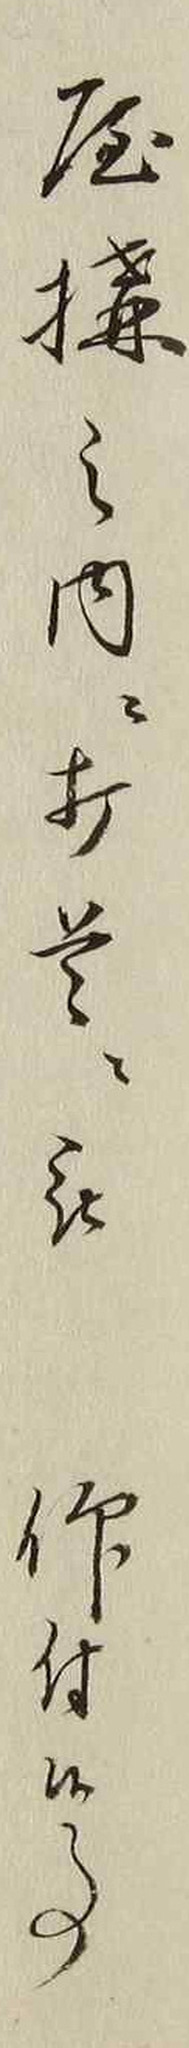屋構之内ニ打首被仰付候事
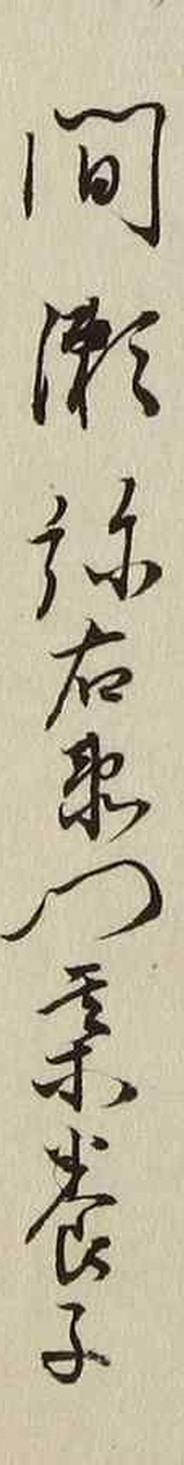間瀬弥右衛門某養子
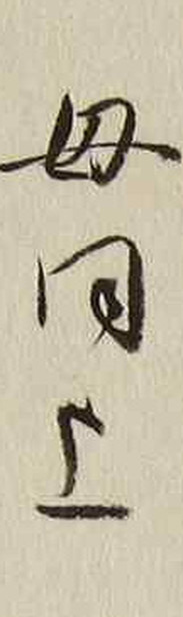母同上
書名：諸士系譜　巻之22　い之部22
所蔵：会津若松市立会津図書館
